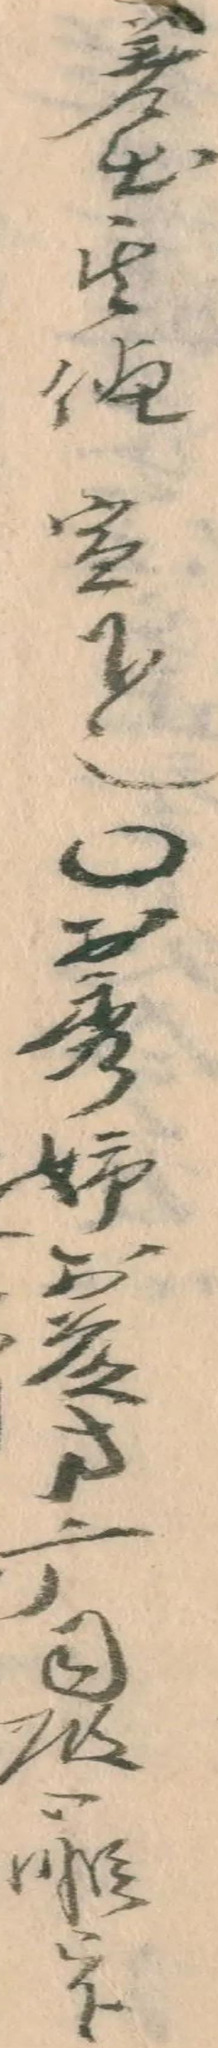差出其儘宣下也○於秀姉前藤方鷹司殿御暇被下
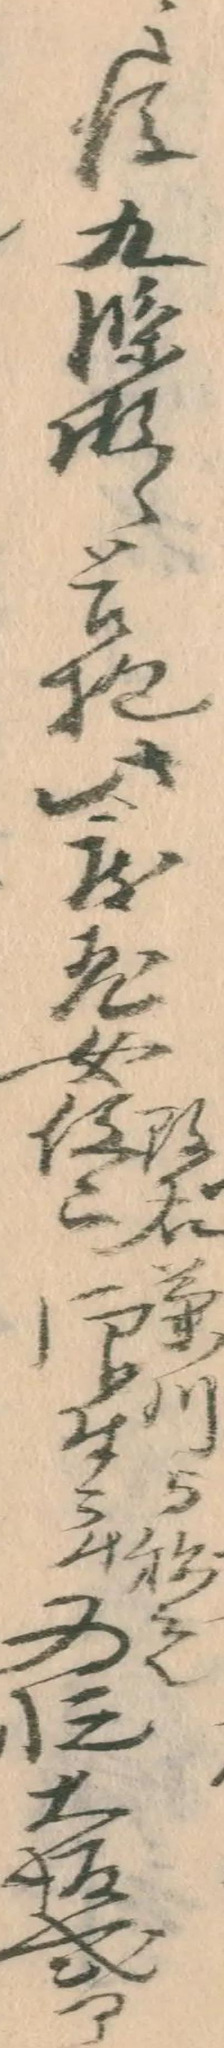之後九條殿へ被召抱此度老女役被仰付ニ付為祝大坂式部
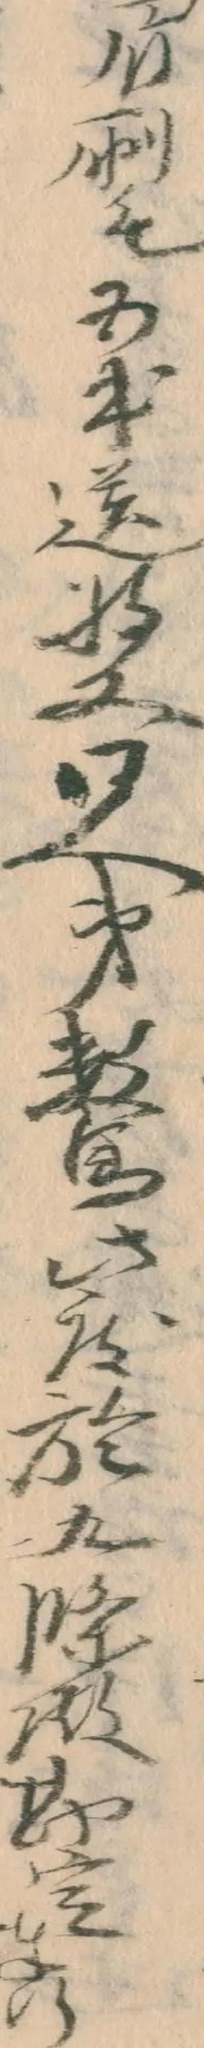眉刷毛五本送将又同人弟数馬此度於九條殿勘定奉行
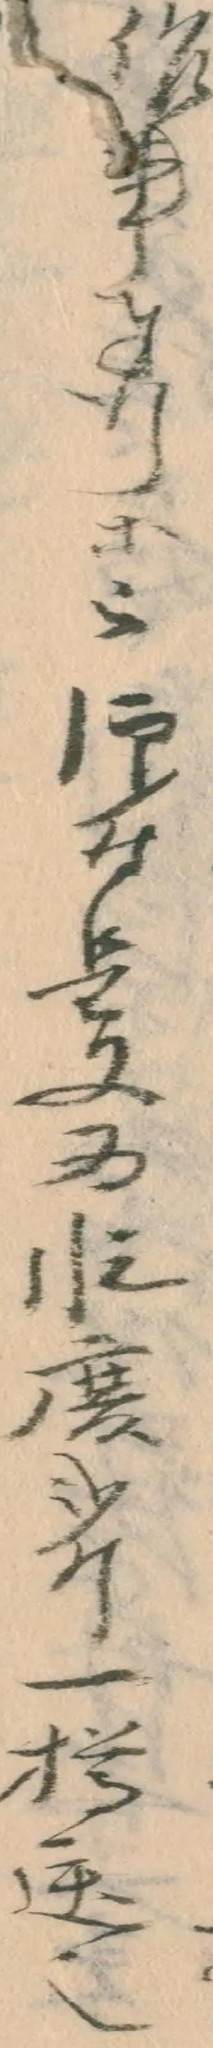作事奉行等被仰付是又為祝慶弐片一樽送之
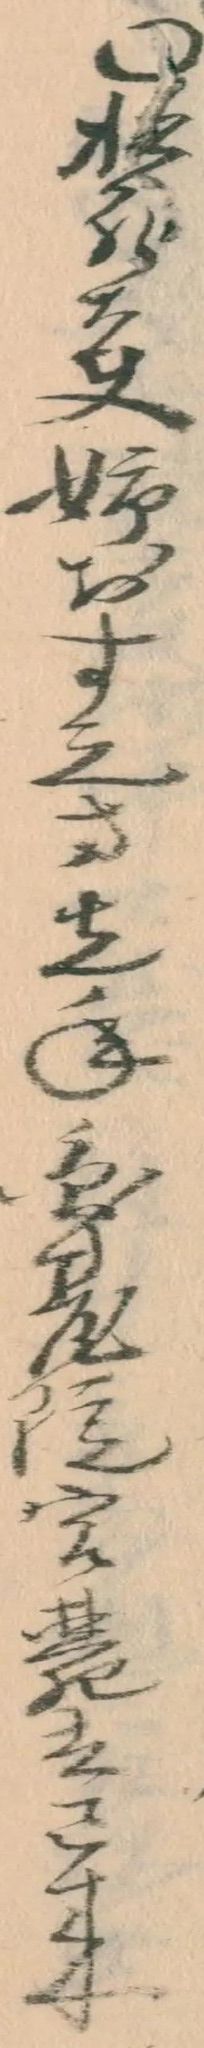〇大夫姉おすえ方先年圓臺院宮薨去已来
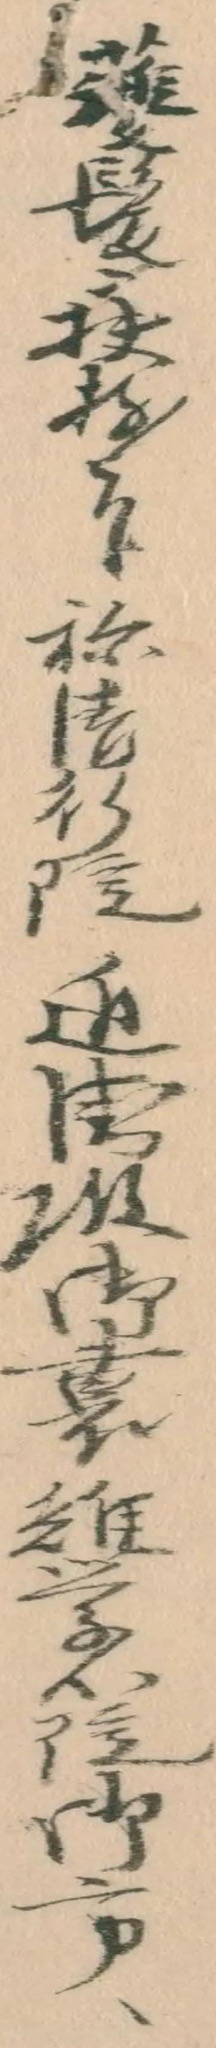薙髪御扶持被下称清行院近衛殿御裏維学心院御方へ
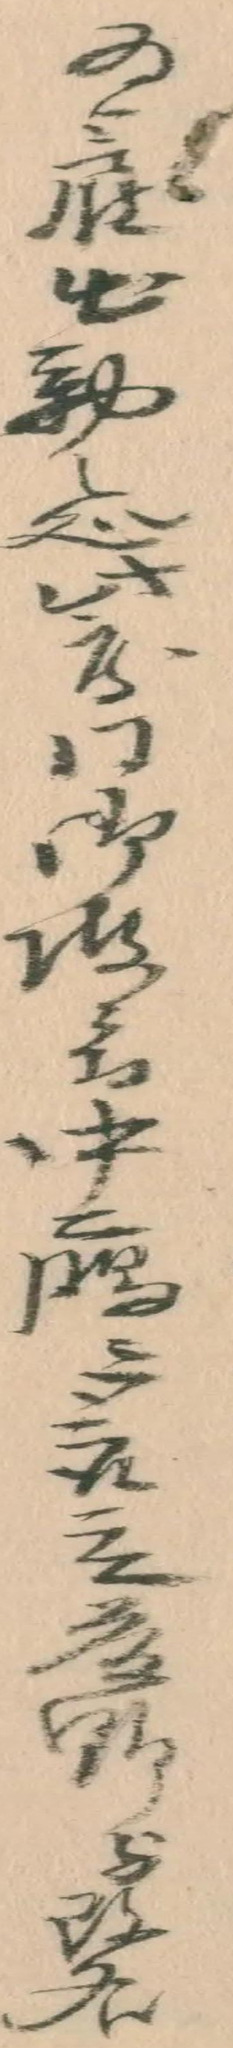為雇出勤之処此度同御殿ニ而中臈ニ御取立藤野与改名
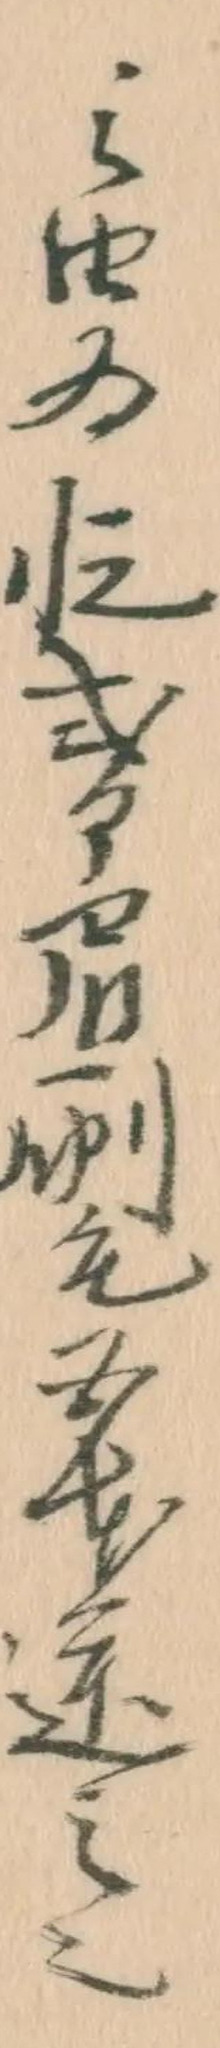之由為祝式部眉刷毛五本送之也
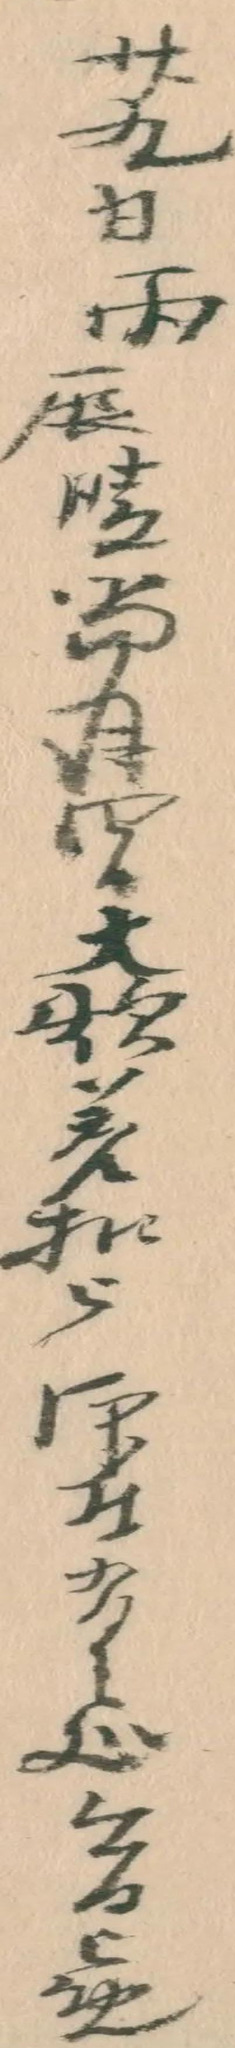廿九日丙辰晴當月四日大炊差押さ被仰付有之処今日被免
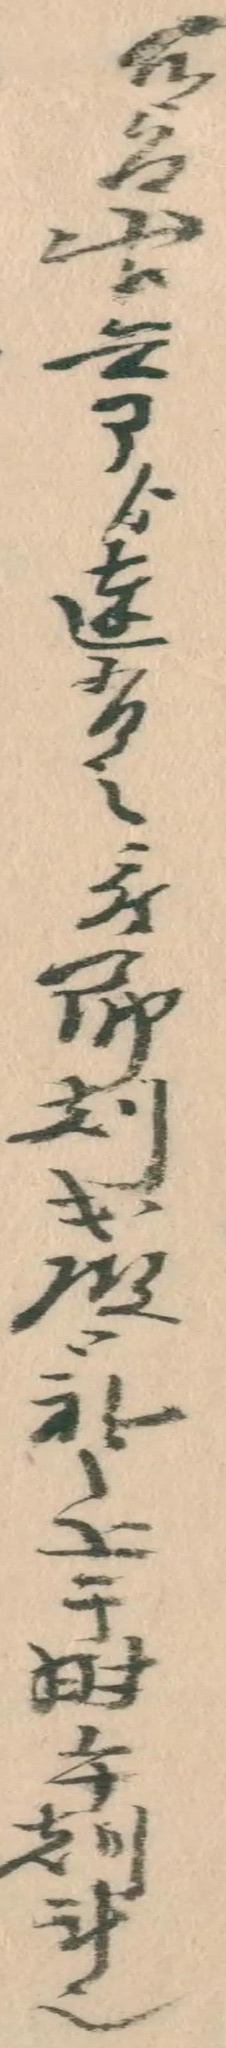候旨山口兵部ゟ達有之ニ付即刻出殿御礼申上于時午刻斗也
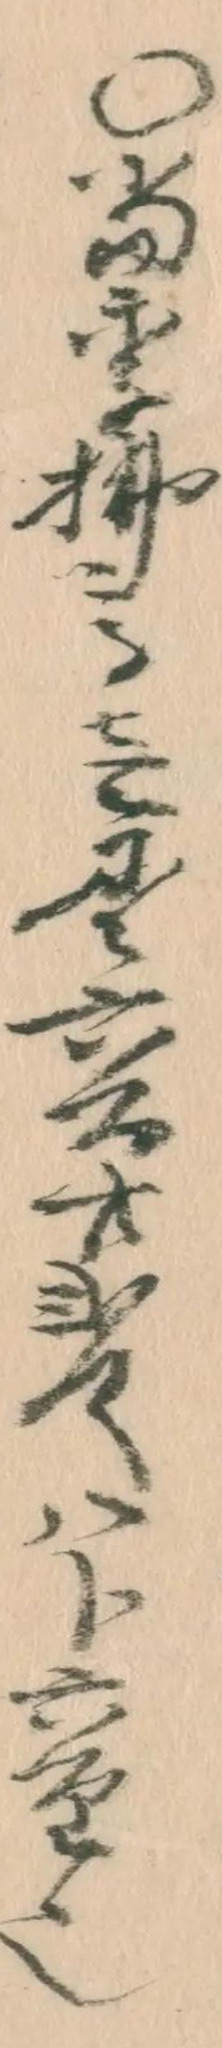○當季払高壱貫六百廿弐匁八分六厘也
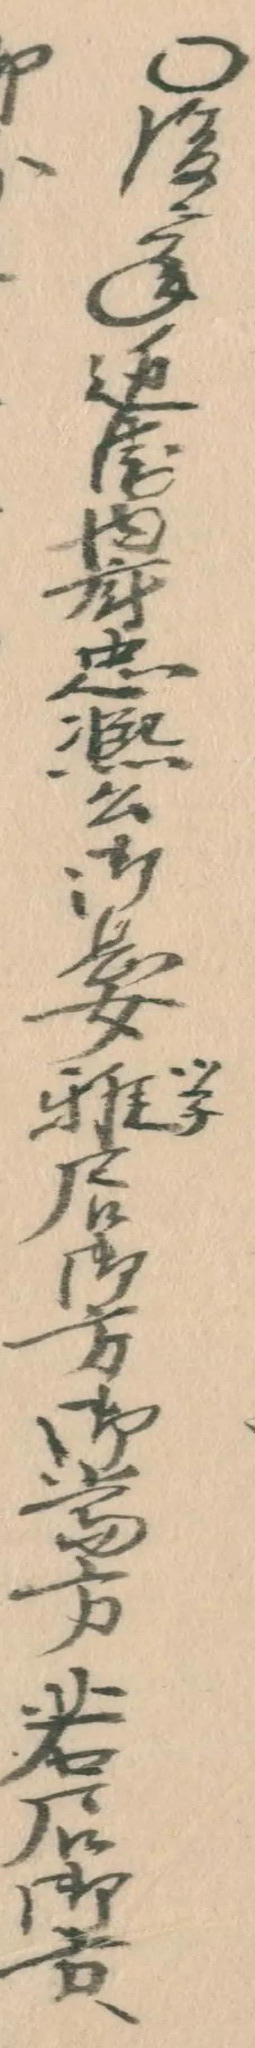○後ニ承近衛内府忠熙公御息女雅君御方御當方若君御方へ
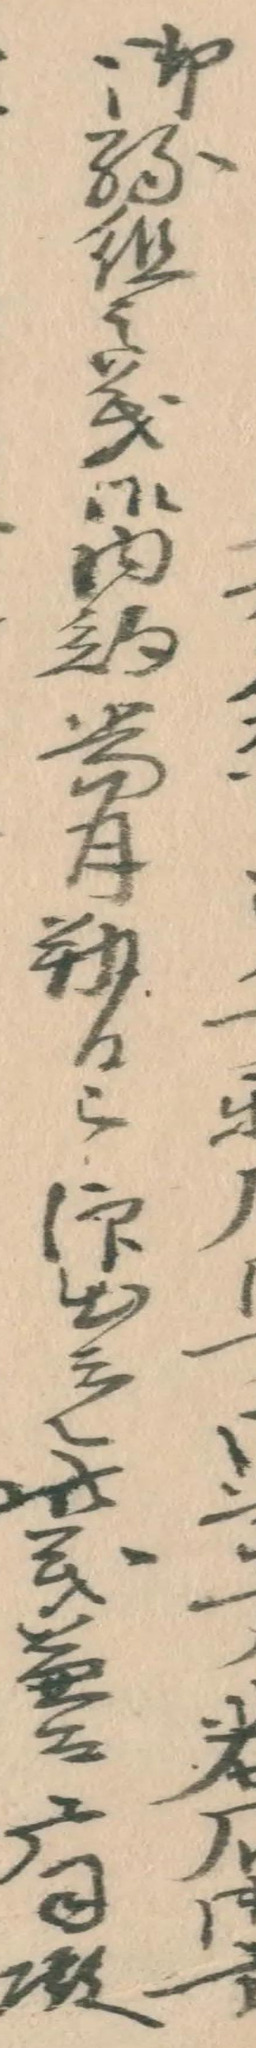御縁組之義御内約當月朔日被仰出云々此義兼而鷹司殿
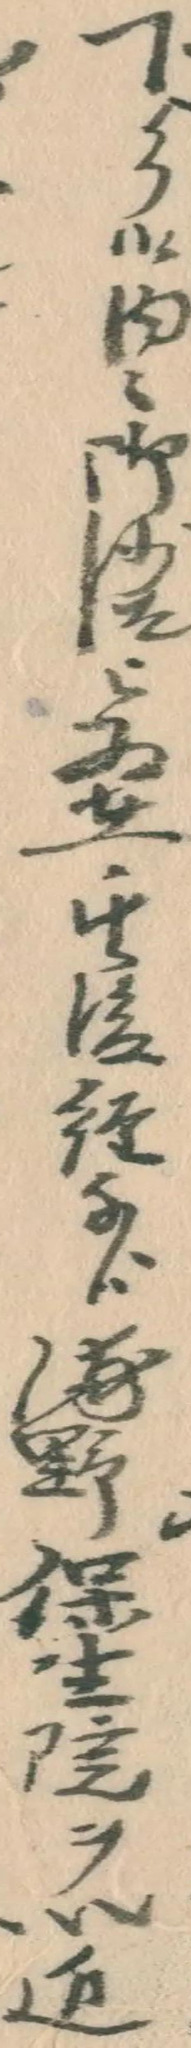下より御内々御沙汰被為在其後経子ゟ浦野保生院を以近
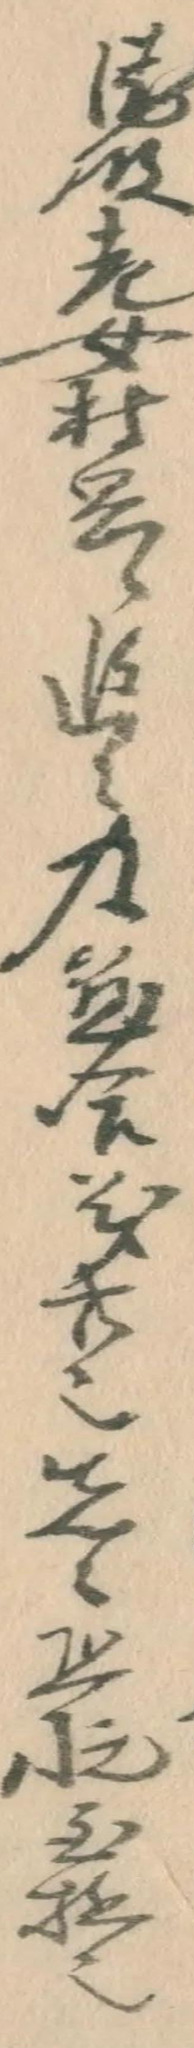衛殿老女村岡へ追々及懸合義者也先々恐悦至極也

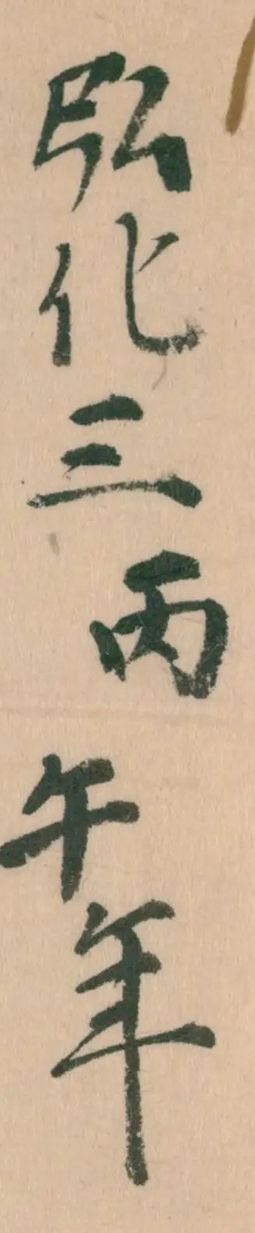弘化三丙午年
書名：賀茂社記録. 第70冊
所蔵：国立国会図書館 National Diet Library, JAPAN
